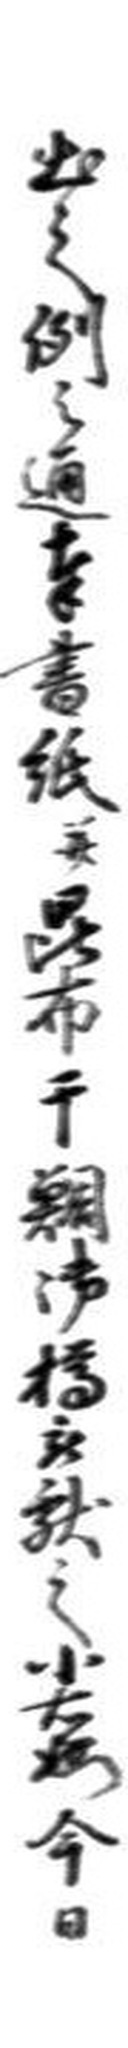出之例之通奉書紙并昆布干鯛御樽被献之小右衛門今日
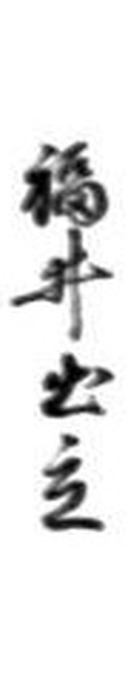福井出立
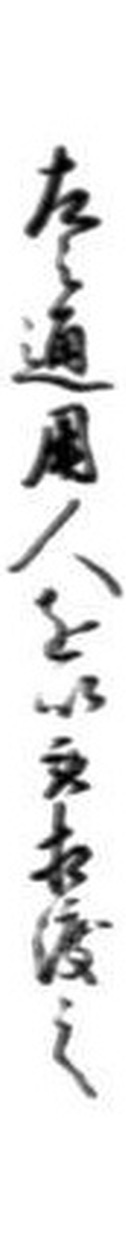左之通用人を以被相渡之

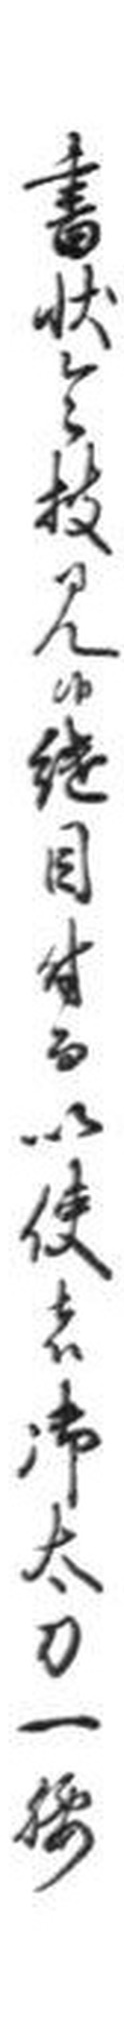書状令披見候継目付而以使者御太刀一腰
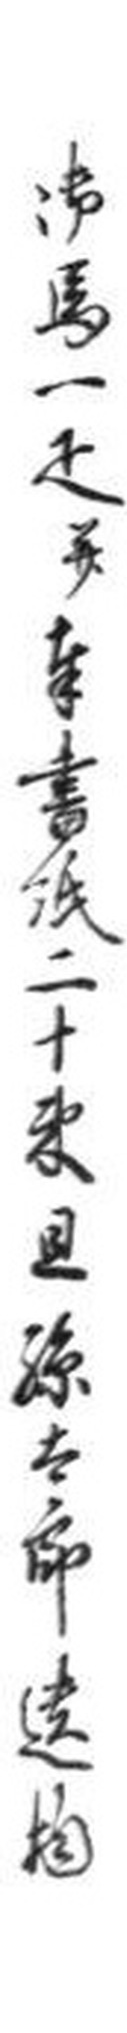御馬一疋并奉書紙二十束且孫太郎遺物
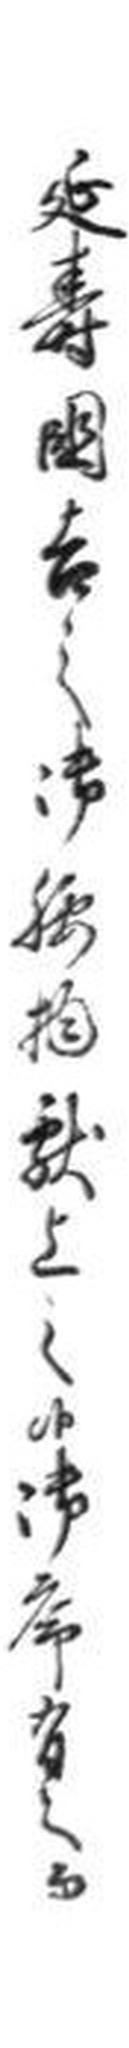延寿国吉之御腰物献上之候御序有之而
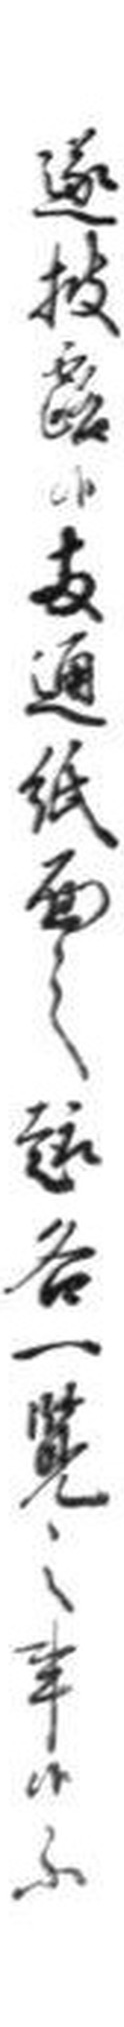遂披露候両通紙面之趣各一覧之事候不
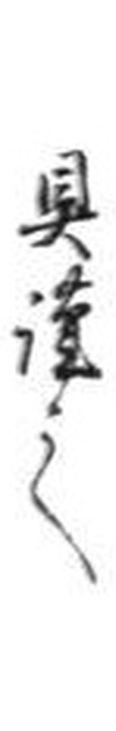具謹言
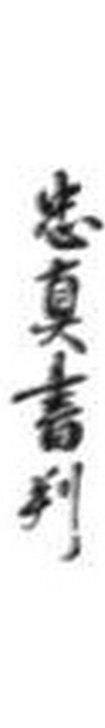忠真書判
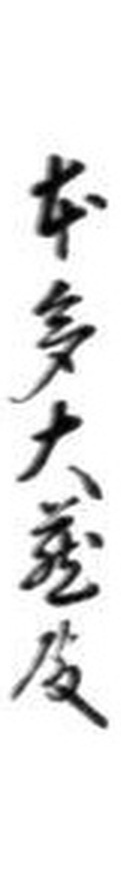本多大蔵殿
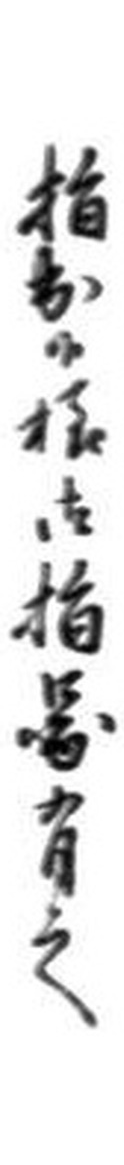指出候様御指図有之
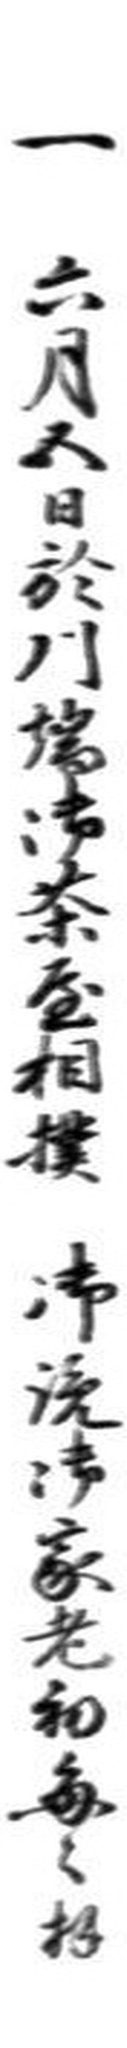一六月五日於川端御茶屋相撲御覧御家老初毎々拝
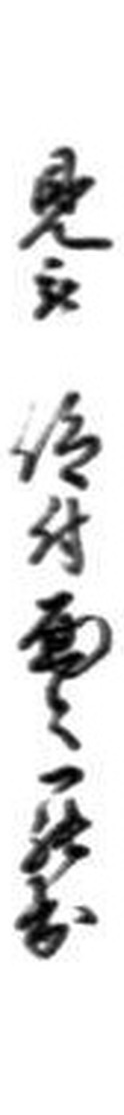見被仰付面々罷出
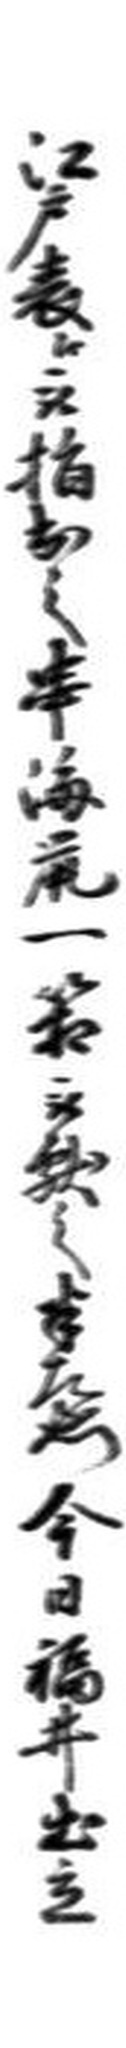江戸表江被指出之串海鼠一箱被献之半左衛門今日福井出立
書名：家譜 三十二 吉邦公 従享保二年到享保三年
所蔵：福井県文書館 Fukui Prefectural Archives
